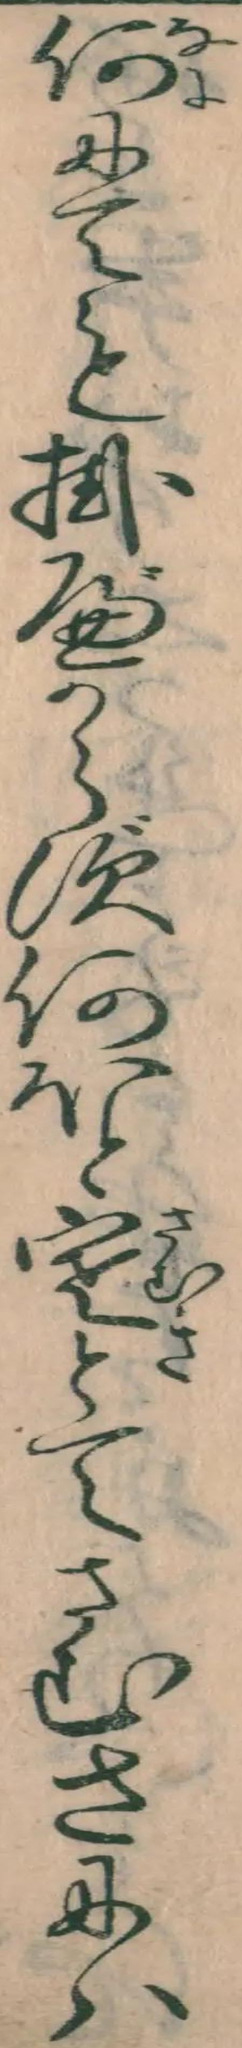何にても掛べからず何ほと寒とてさむさには
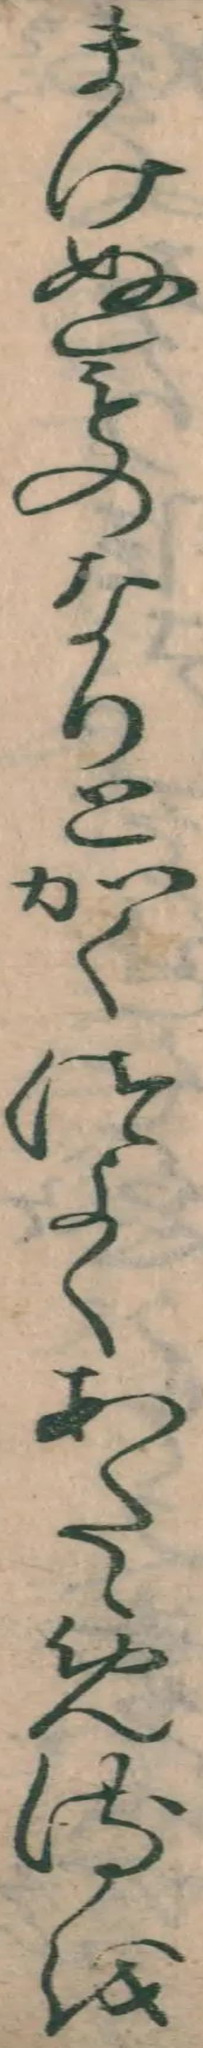まけぬものなりとかくつよくあたゝめるを

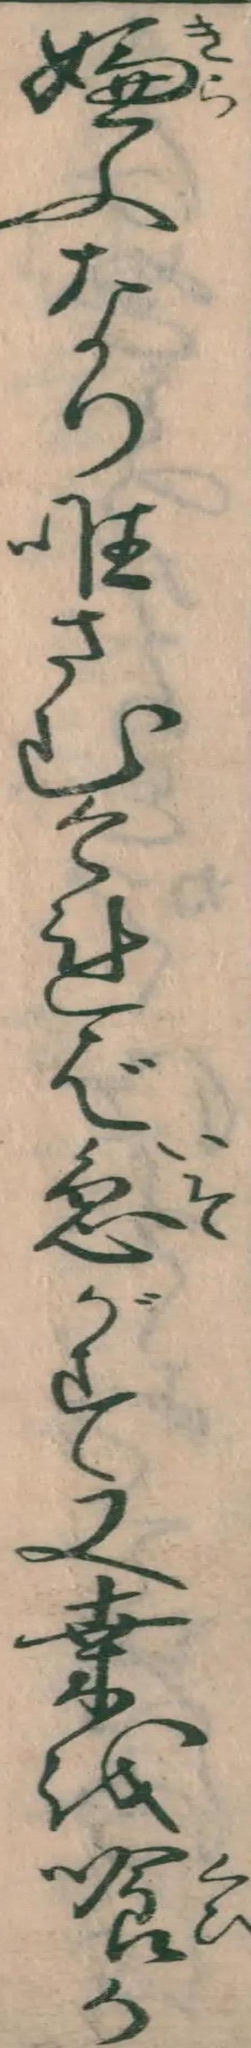嫌ふなり唯さむければ急がす又桑を喰か
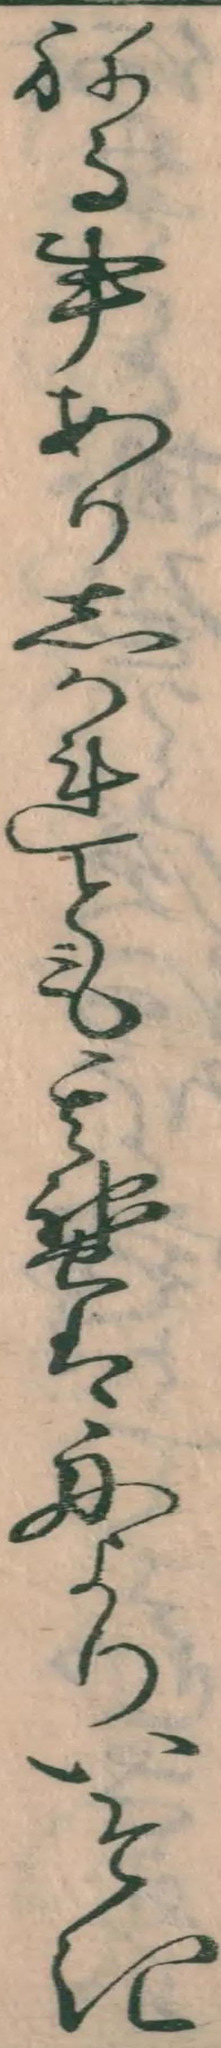ねる事ありしかれとも其䗝は舟よりいそぎ
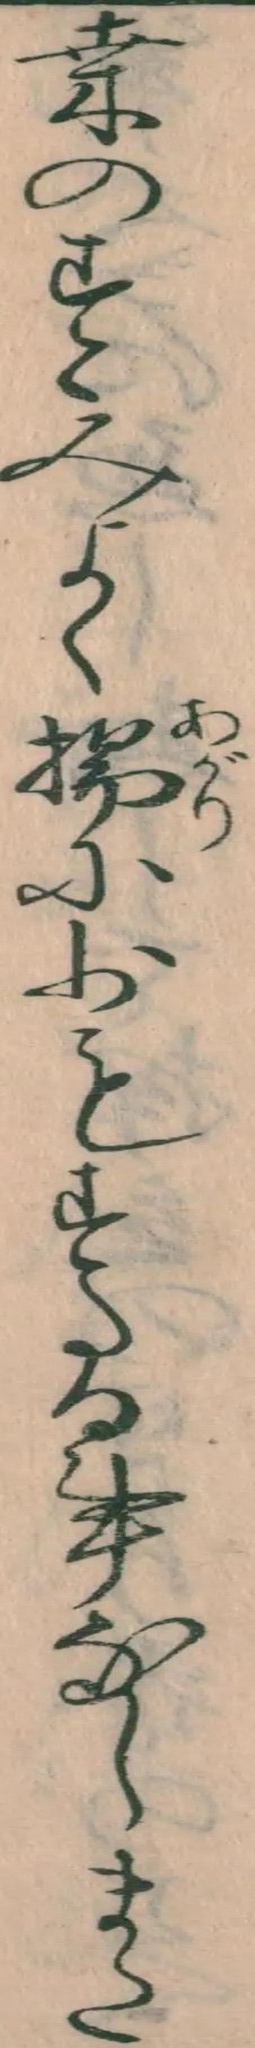桑のすゝみよく揚に少もすたる事なしまた
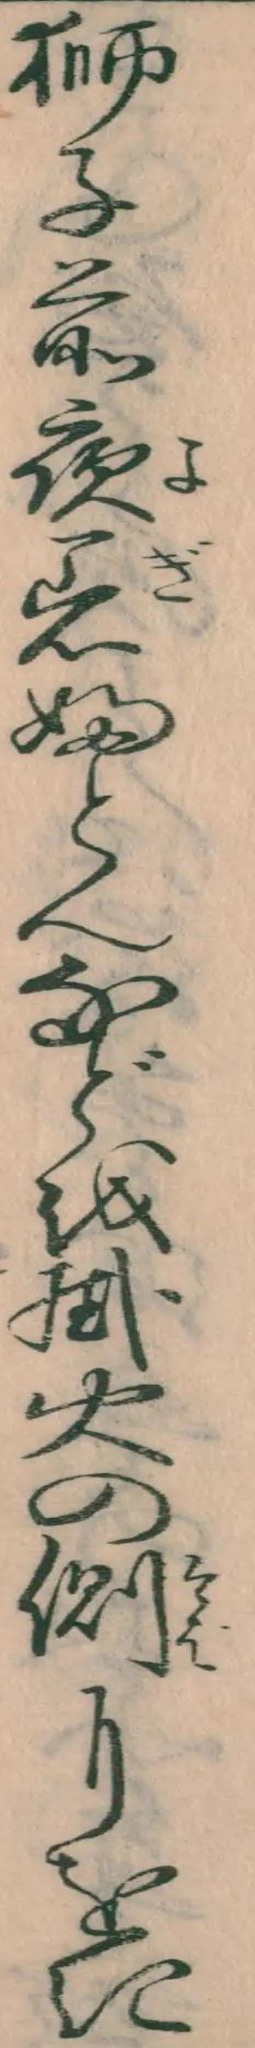獅子前夜着ふとんなどを掛火の側にをき
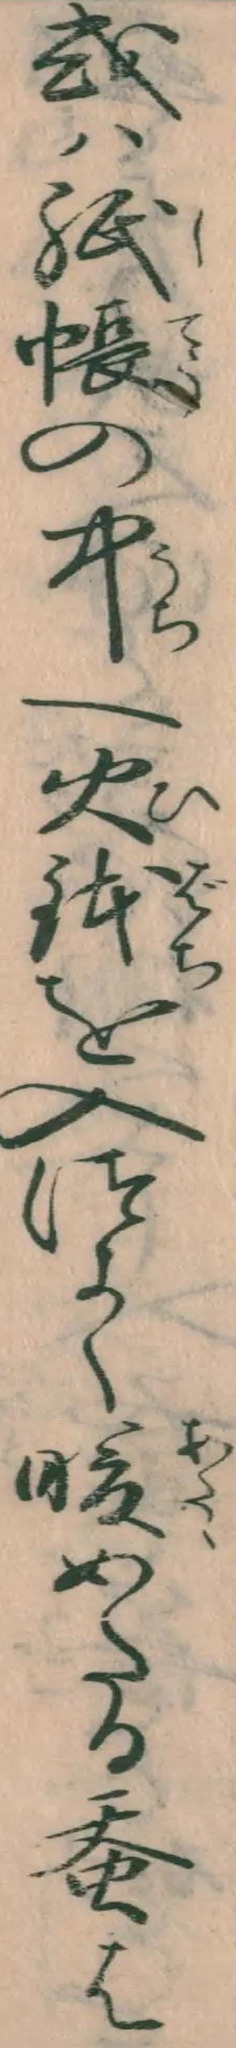或は紙帳の中へ火鉢を入つよく暖めたる蚕は
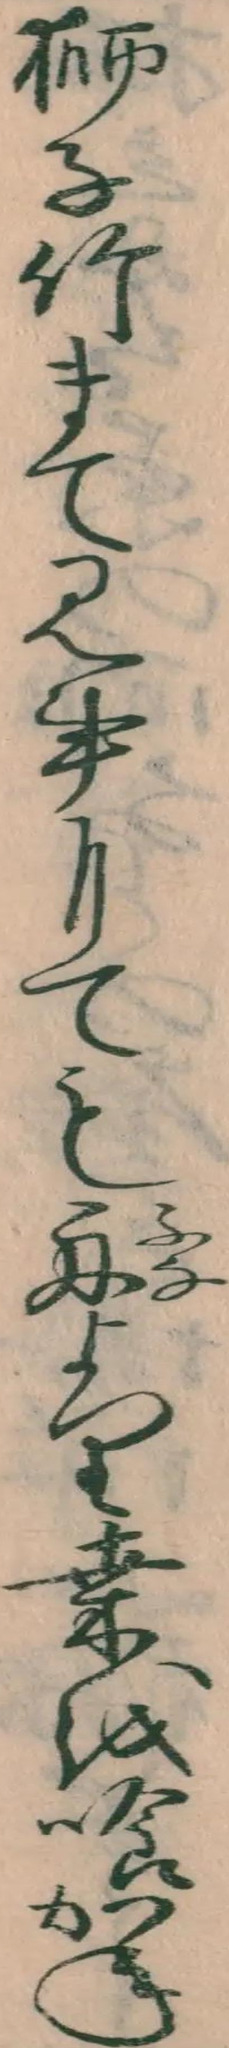獅子竹まて見事にても舟より桑を喰かね
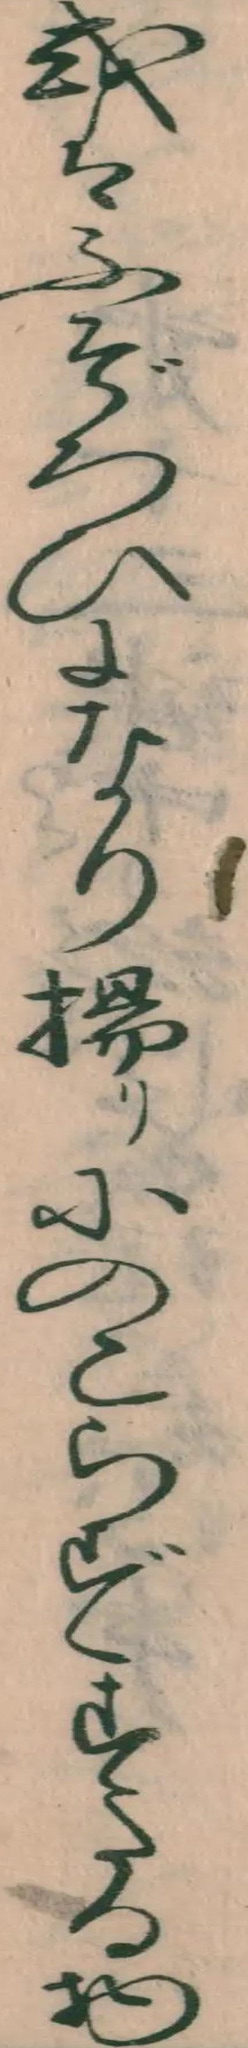或はふぞろひになり揚りにのらずすたる物
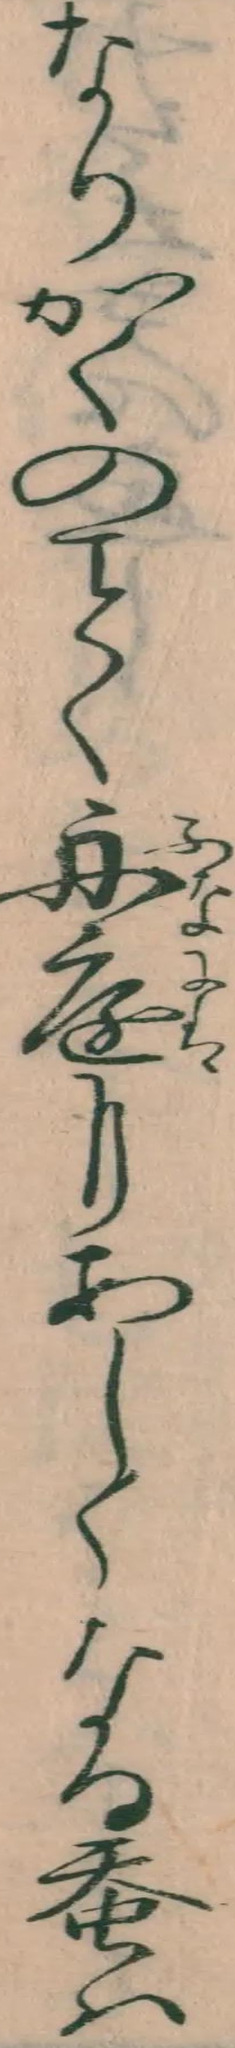なりかくのことく舟庭にあしくなる蚕は
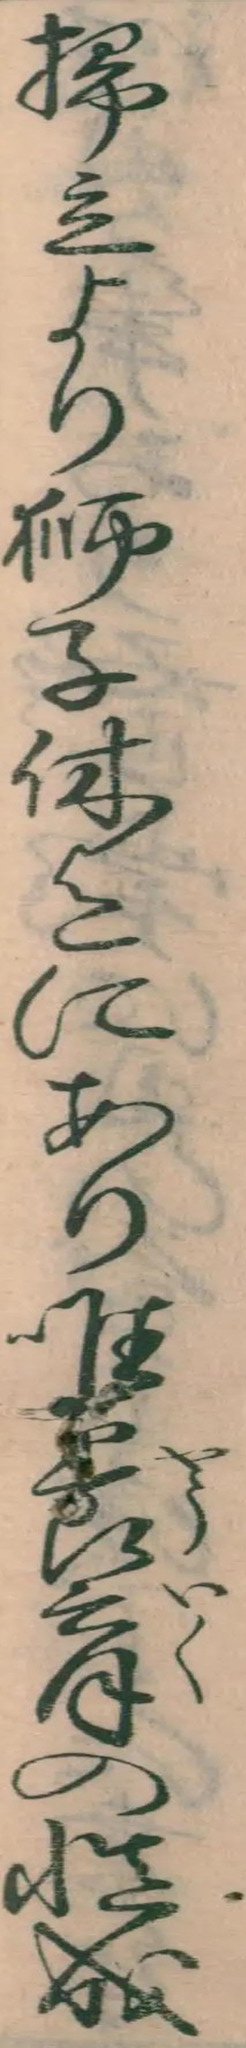掃立より獅子休迄にあり唯養育の慥成
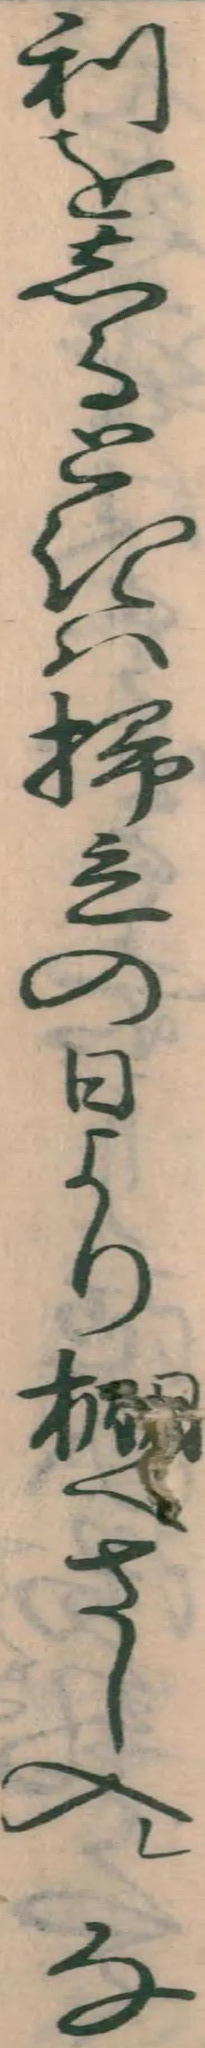りをしるときは掃立の日より棚へさし入れな
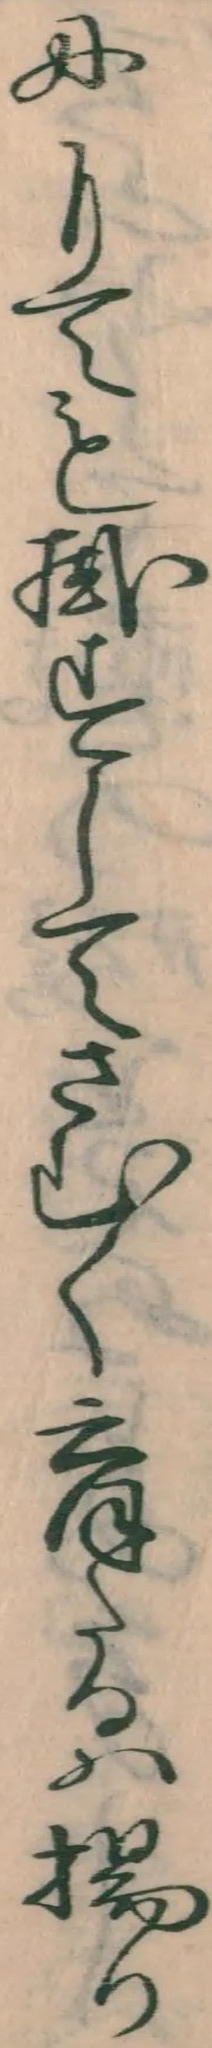ににても掛すしてさむく育たるは揚り
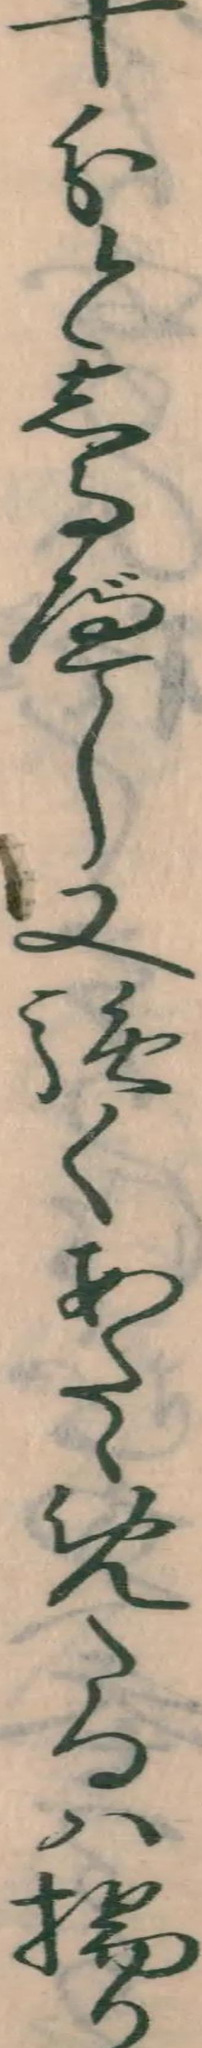十分としるべし又強くあたゝめたるは揚り
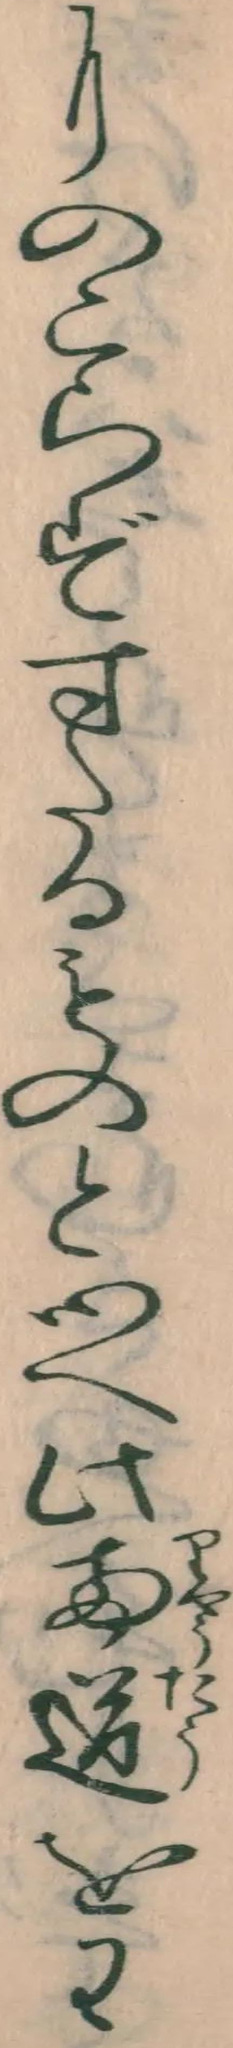にのこらずすたるものと心へ此両道をわ
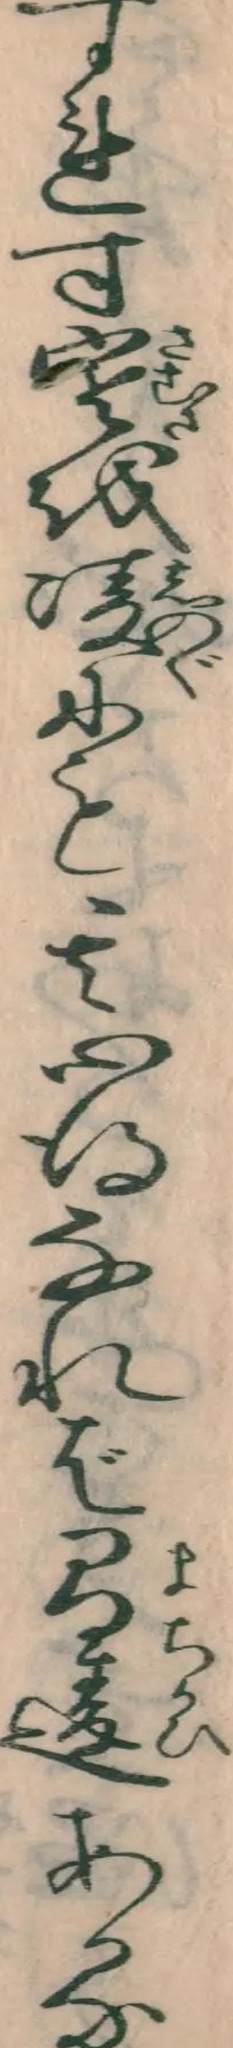すれす寒を凌にも其心得なれば間違ある
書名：新撰養蚕秘書
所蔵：国立国会図書館 National Diet Library, JAPAN
